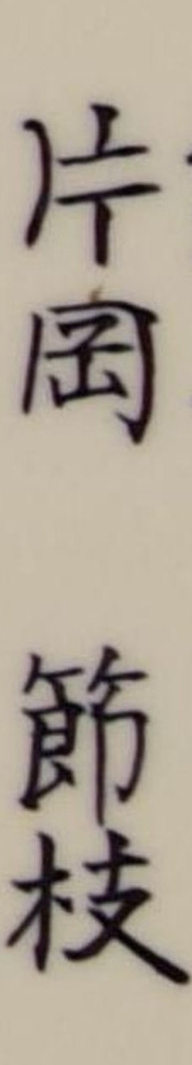片岡節枝
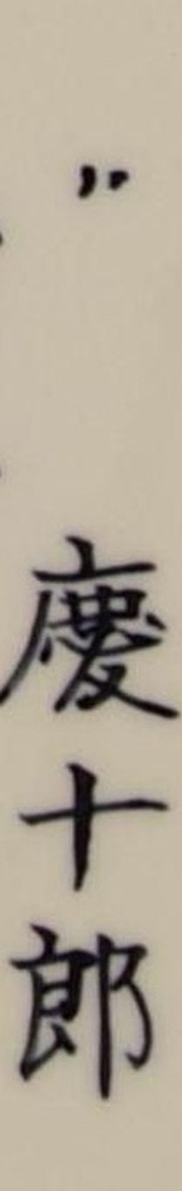慶十郎
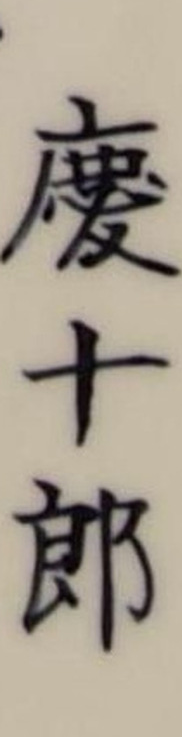慶十郎
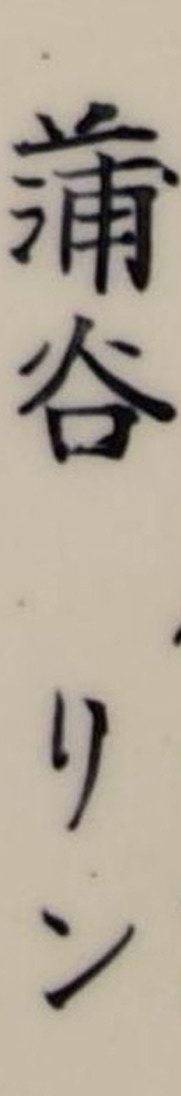蒲谷リン
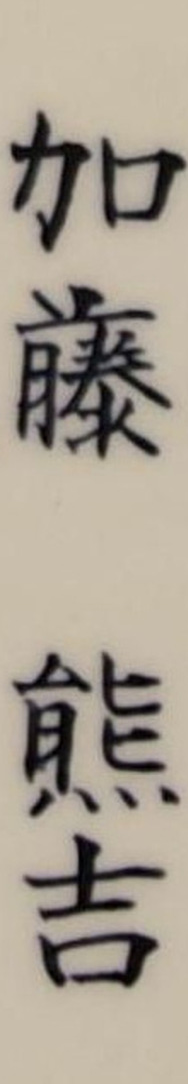加藤熊吉
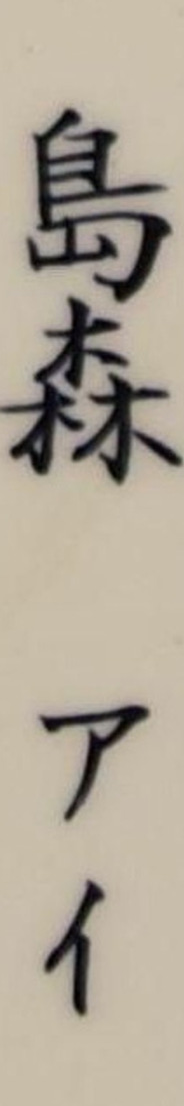島森アイ
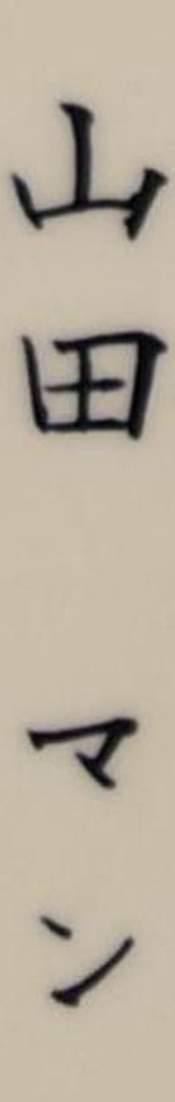山田マン
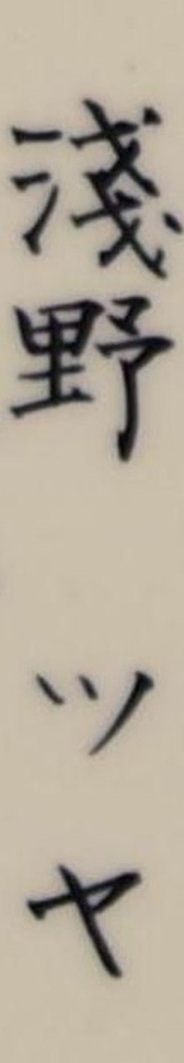浅野ツヤ
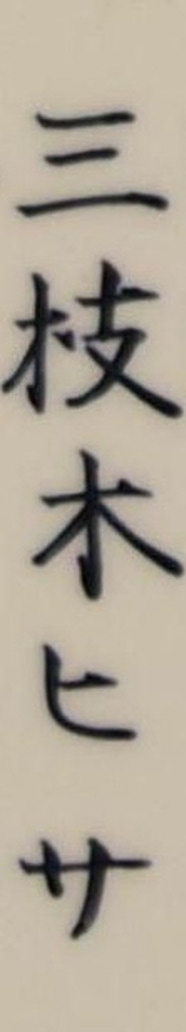三枝木ヒサ
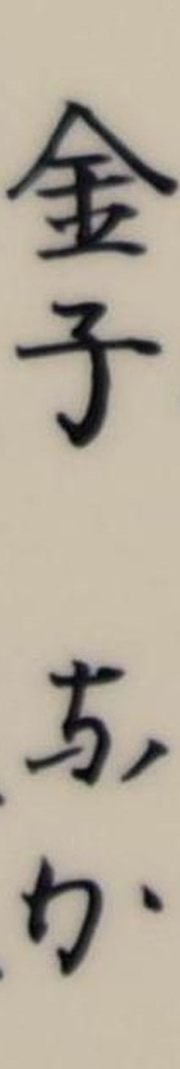金子なか
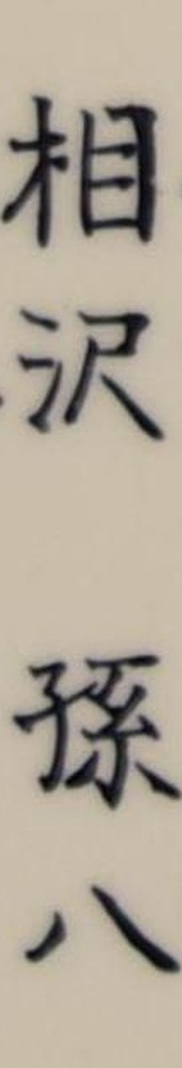相沢孫八
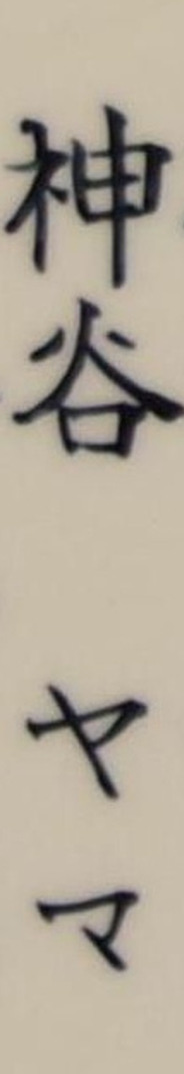神谷ヤマ
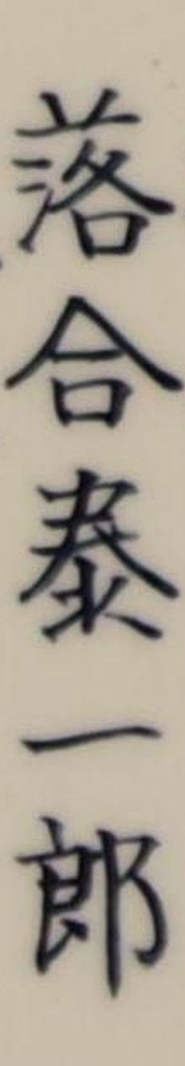落合泰一郎
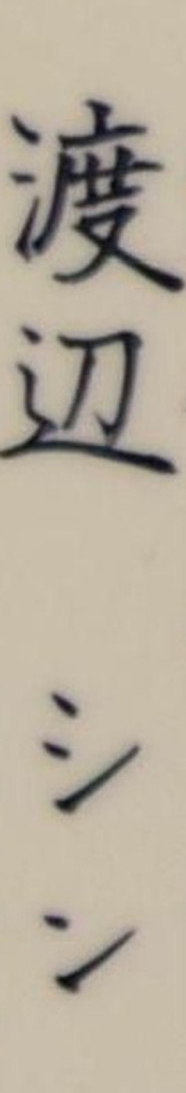渡辺シン
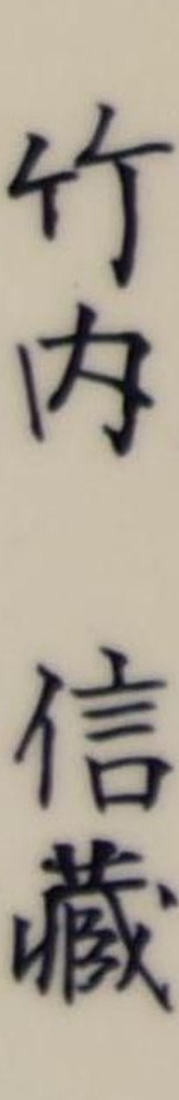竹内信蔵
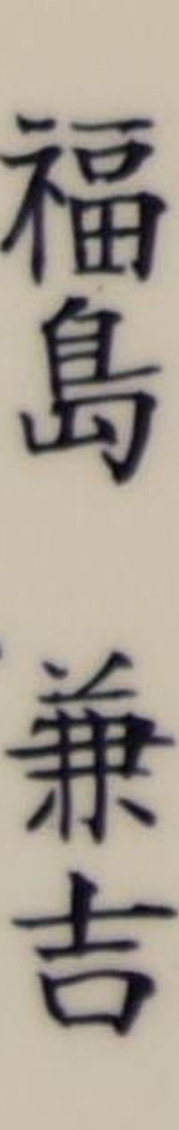福島兼吉
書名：M~S
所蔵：高野山金剛峯寺
